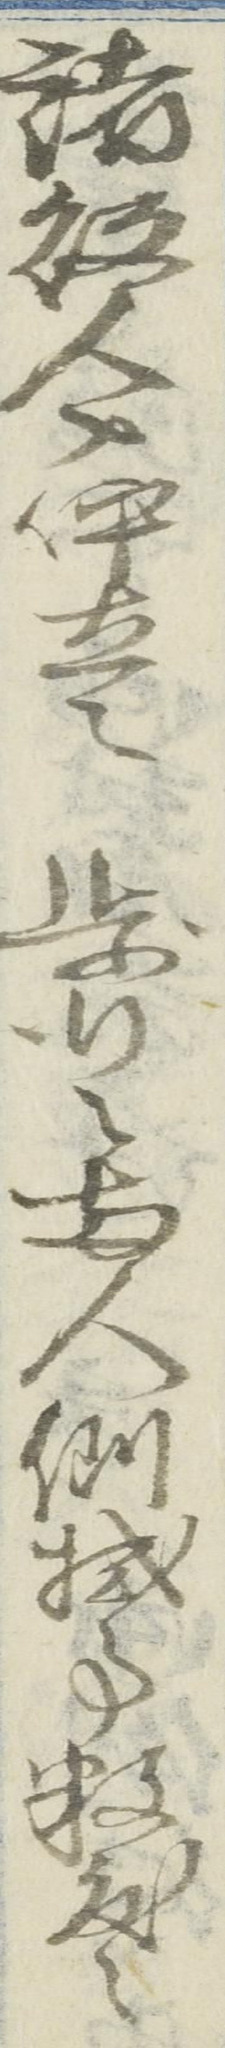諸役人ヲ呼立ニ歩行之両人倒掛事数度之
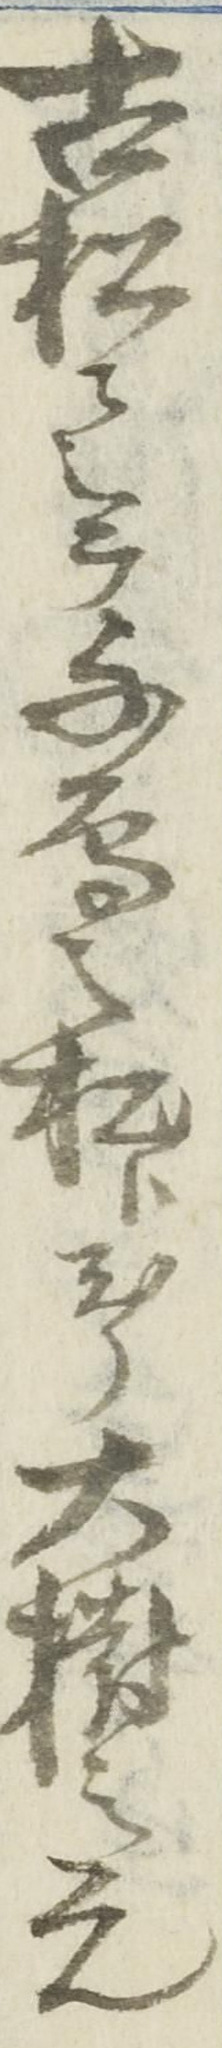古松ニシテ千鳥之松ト云ウ大樹之元
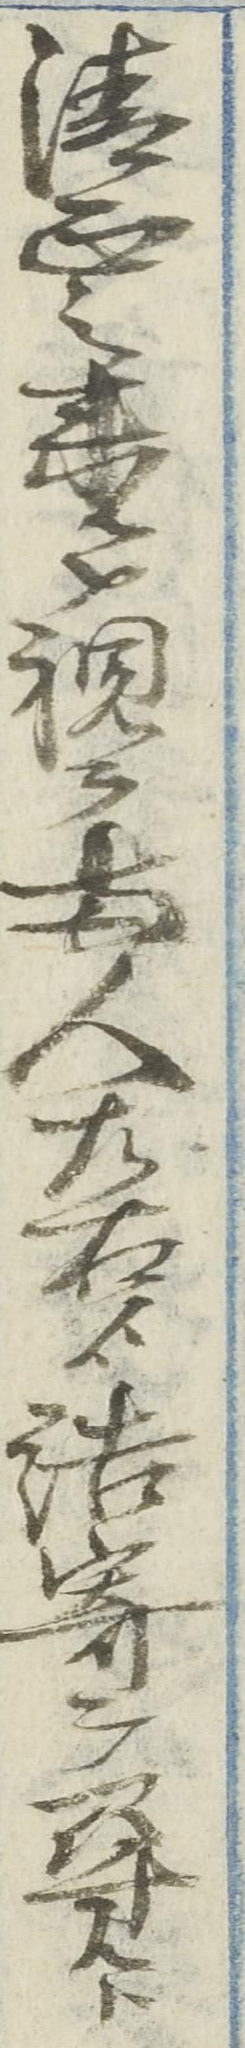清正之来ルヲ視テ両人左右ゟ詰寄テ尋ルト
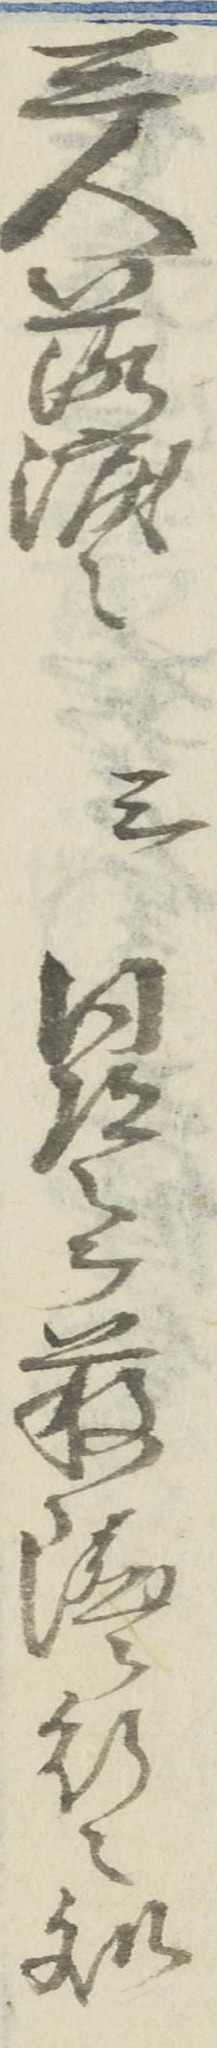三人落涙シ三同道シテ藪陰ニ行之処
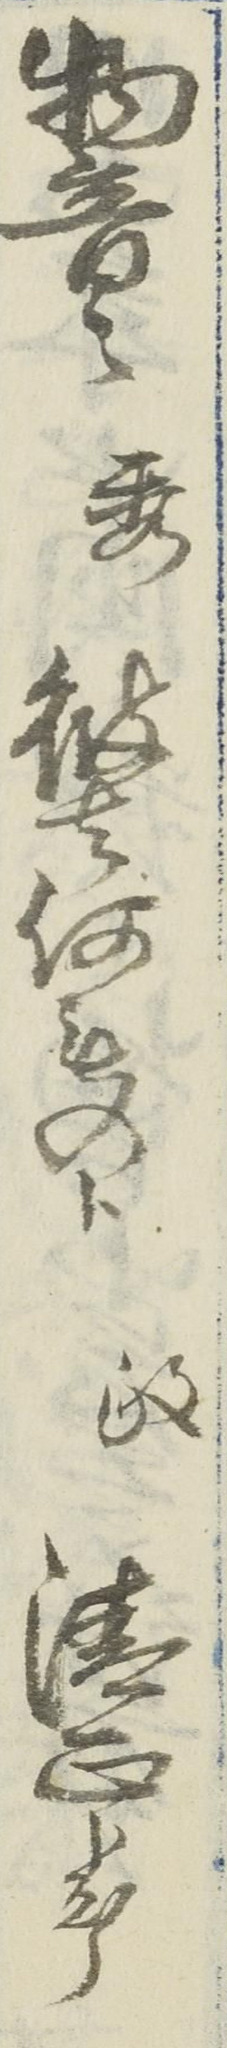物音ニ秀彼は何ものト政清正ト云ウ
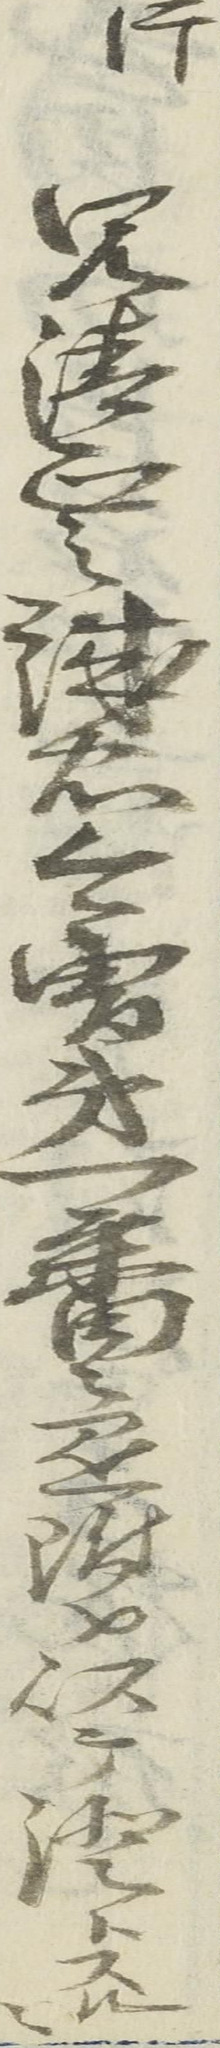片兄清正之誠忠今宵第一番ニ懸附ヲ以テ證トスルニ
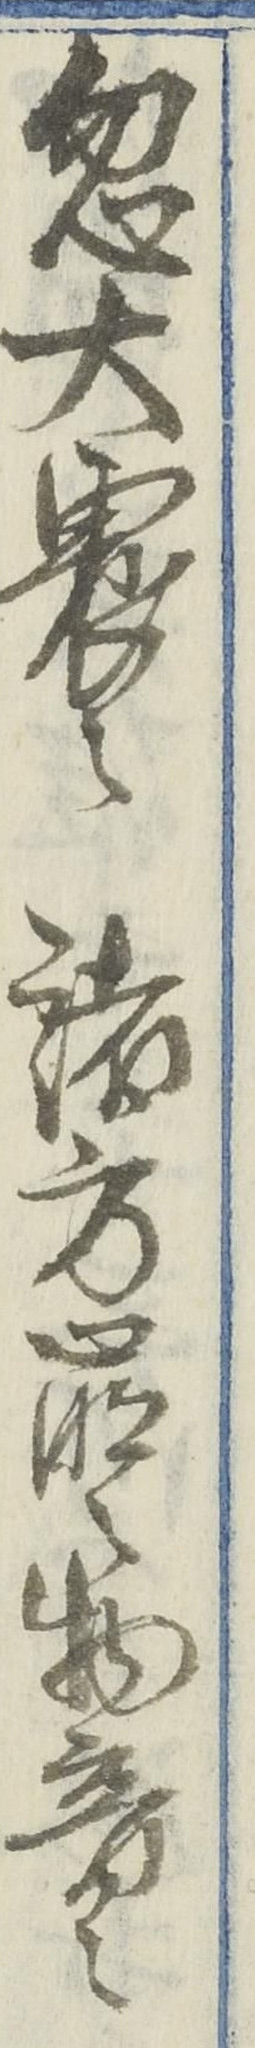忽大震し諸方崩之物音し
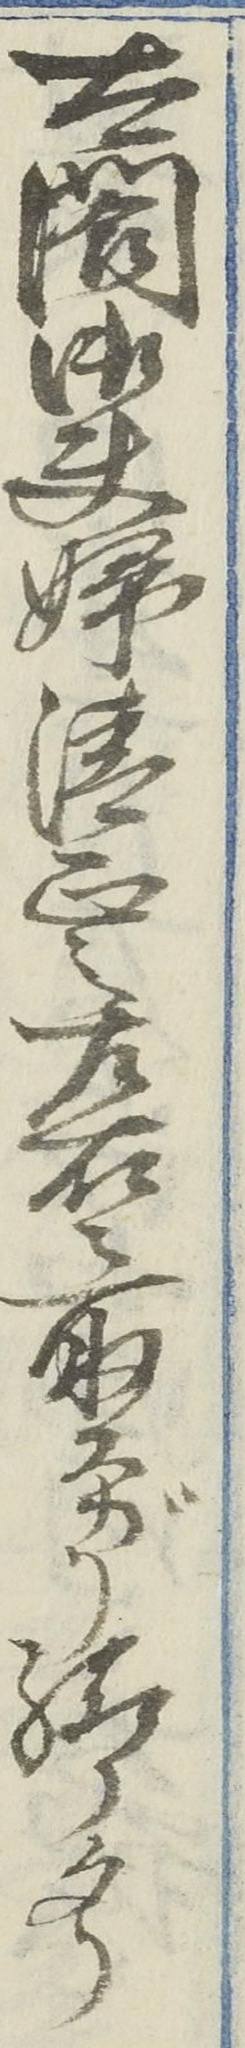太閤御夫婦清正之左右ニ取スガリ給ウタリ
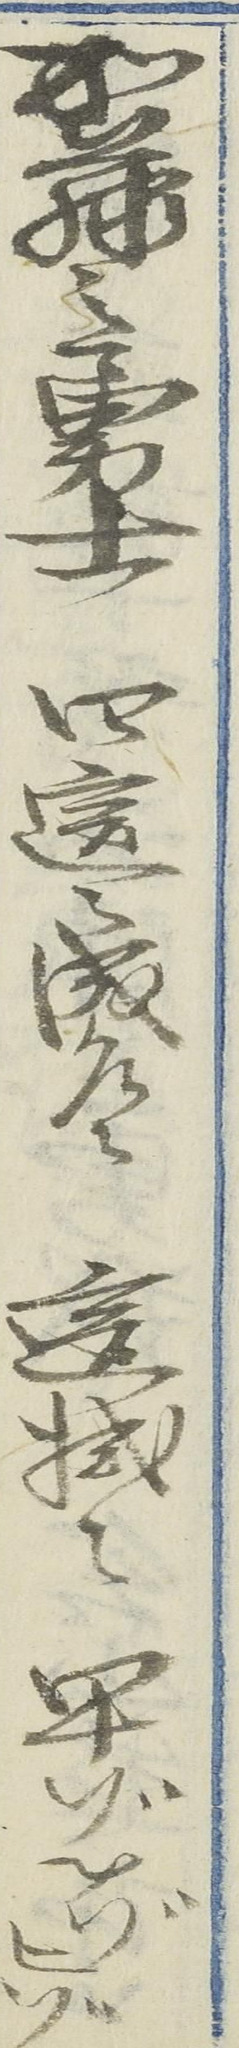加藤之勇士四這ニ成乍ニ這掛ニ早ゾヲゾヒゾ
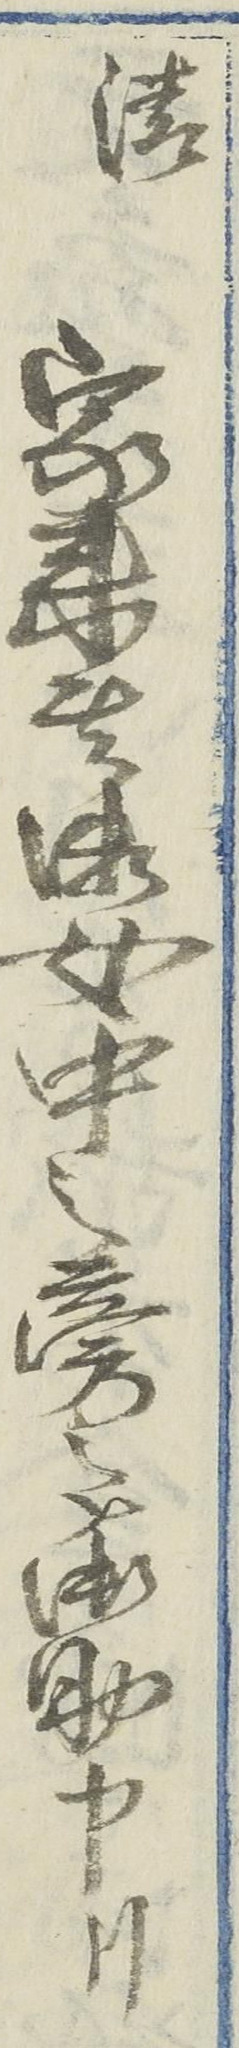清家来共御女中之旁ラヲ御助申
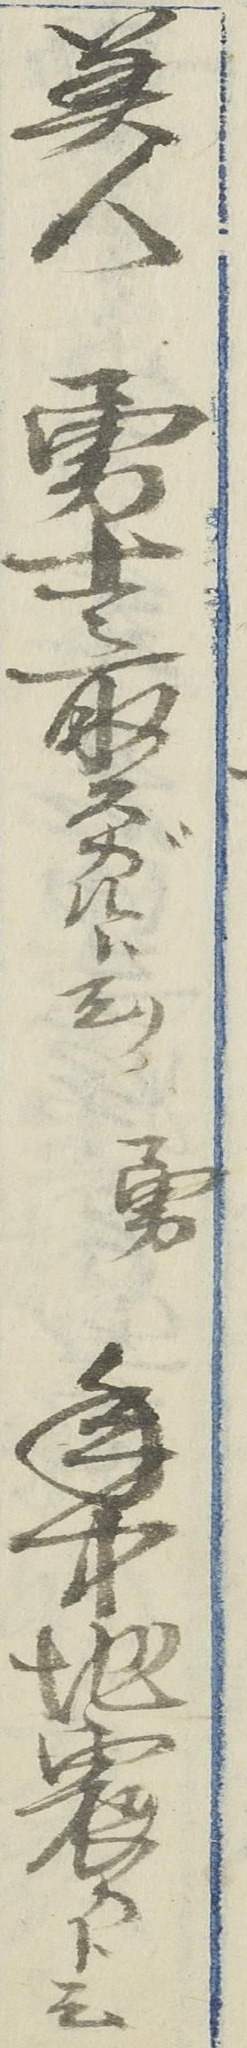美人勇士ニ取スガルト云勇年中地震ヲト云
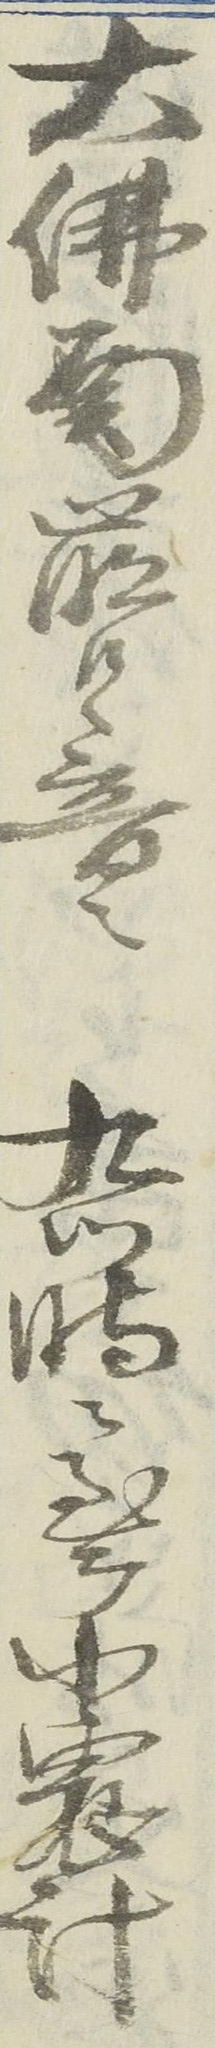大仏殿崩ルヽ音二九ツ時ニ至テ小震計
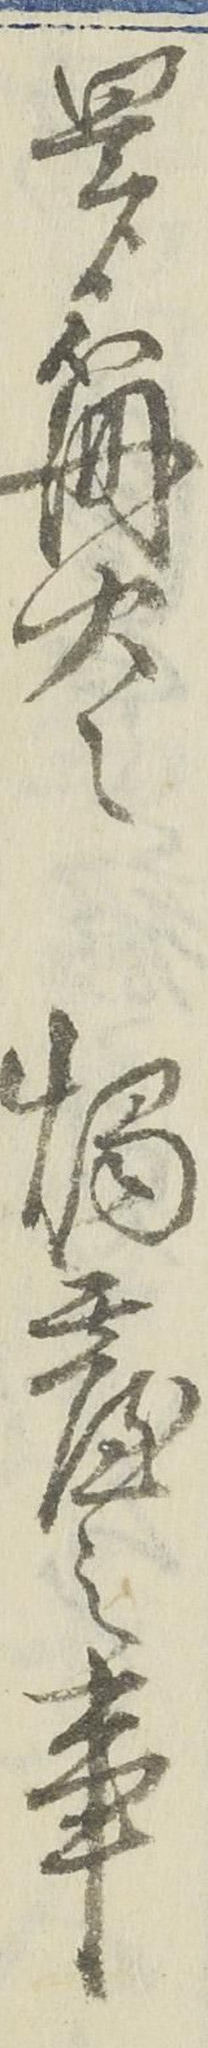是ゟ篝火し燭台之事

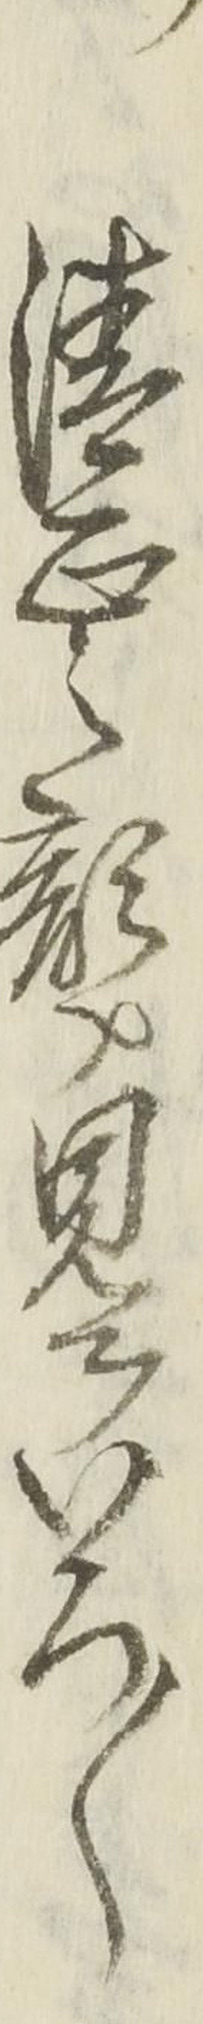秀清正之顔ヲ見ニいろ〳〵
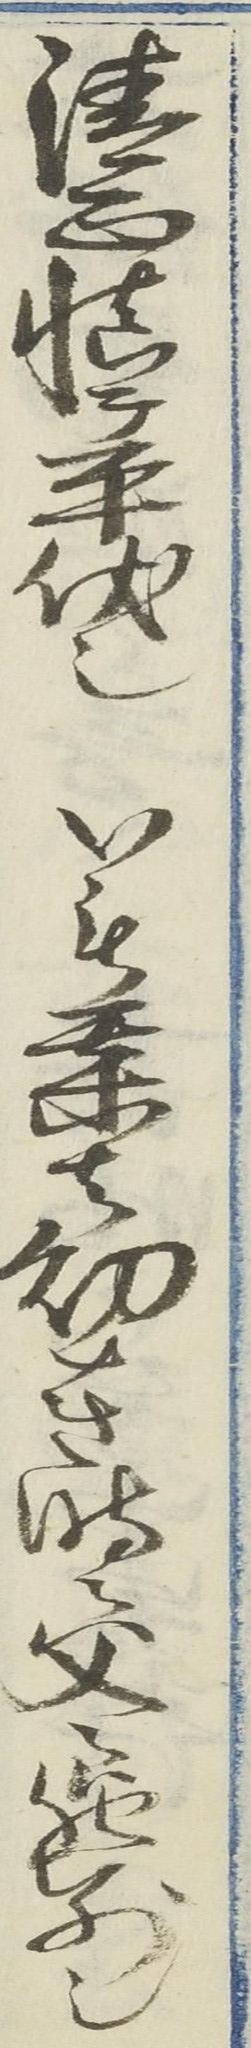清正慎テ平伏シソも某は幼ナき時ニ父ニハ死別シ
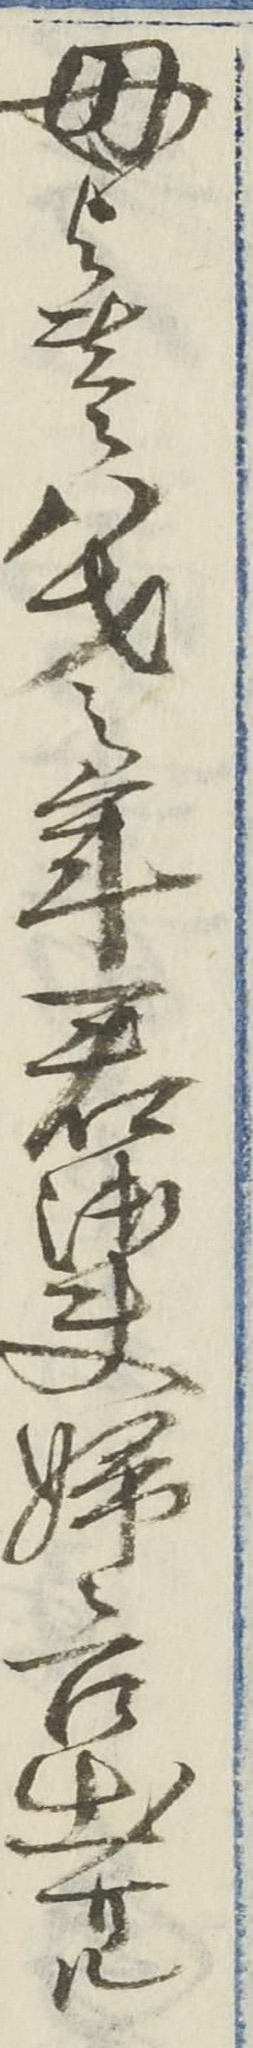母と共ニ八才之年君御夫婦ニ召出サル
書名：伏水大地震
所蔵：東京大学地震研究所図書室 Earthquake Research Institute Library, The University of Tokyo, JAPAN
